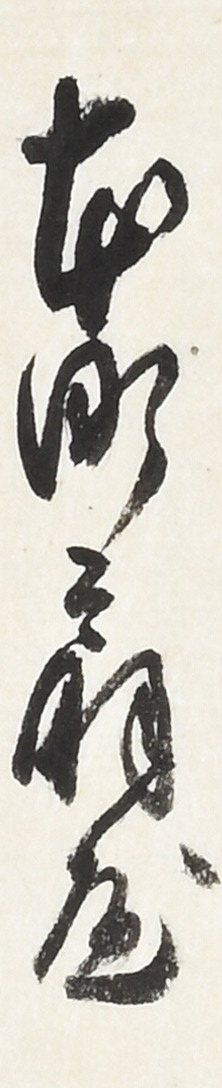本町扇屋
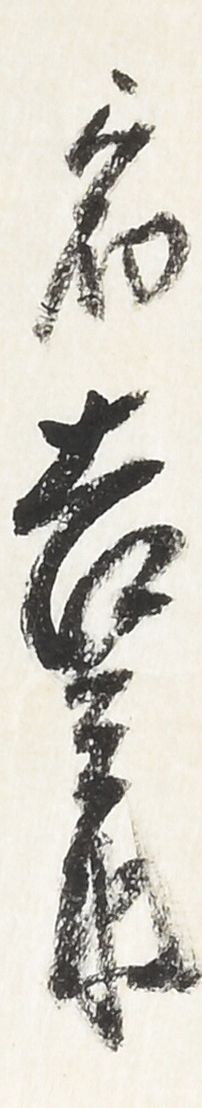宿吉兵衛
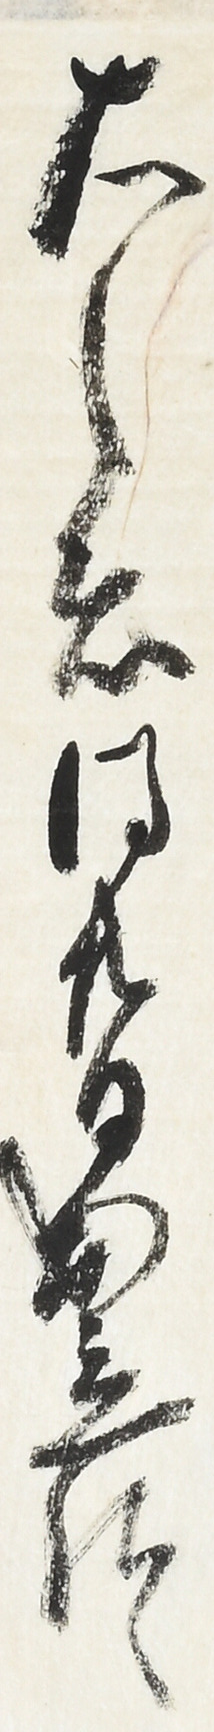右之者同廿日出立仕候

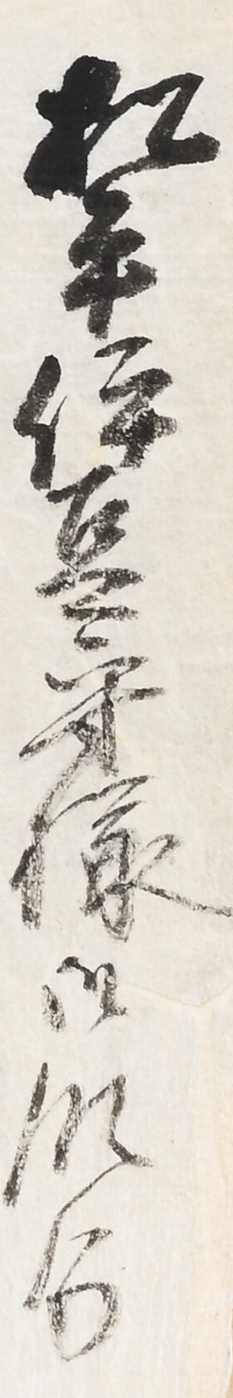松本伊豆守様御領分
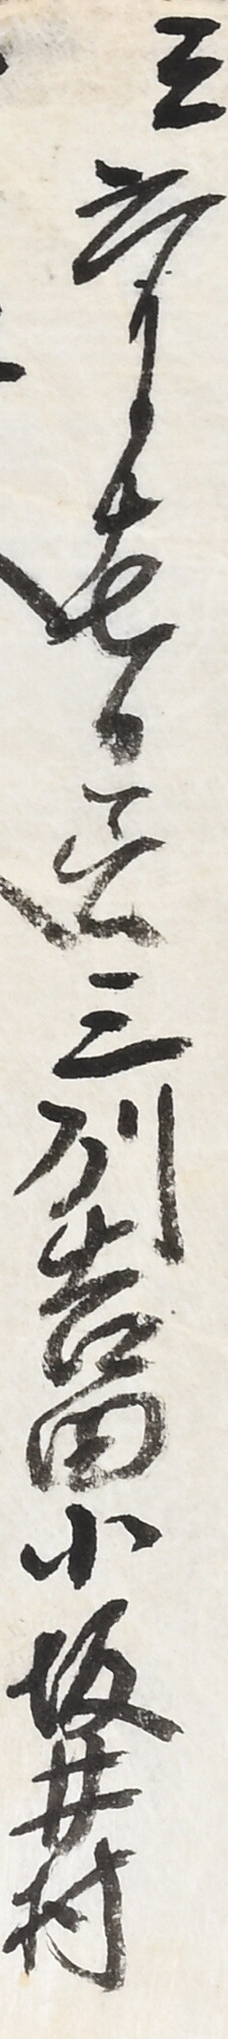壬六月十七日着三州吉田小坂井村
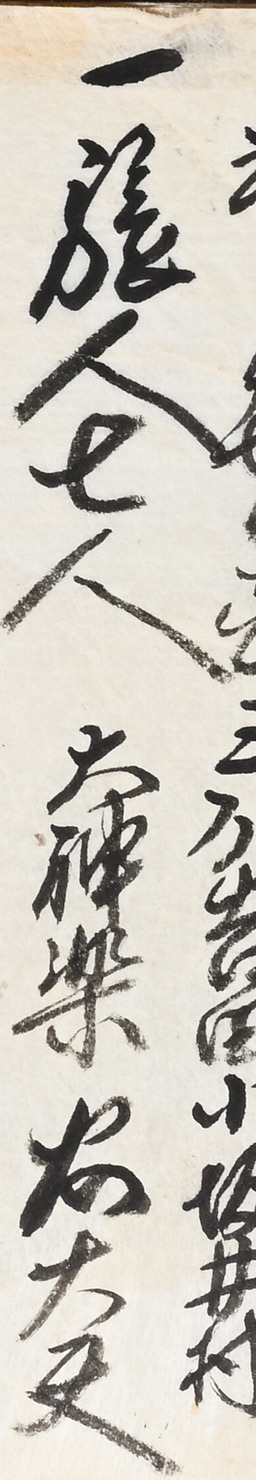一旅人七人大神楽忠大夫
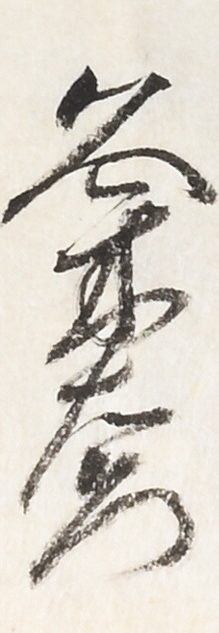久米右衛門
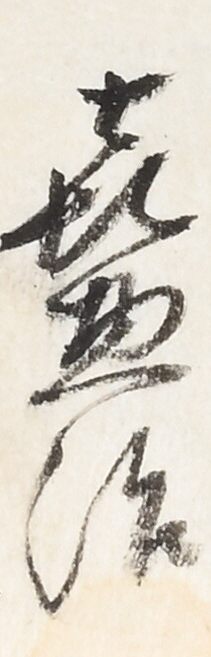喜惣治
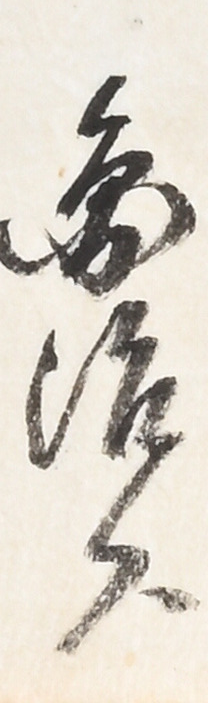円治郎
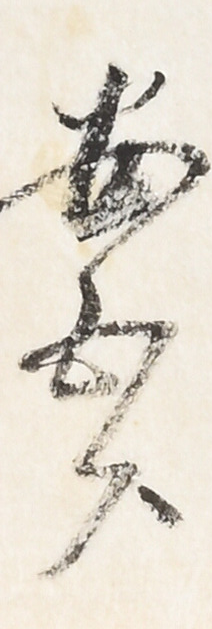安五郎
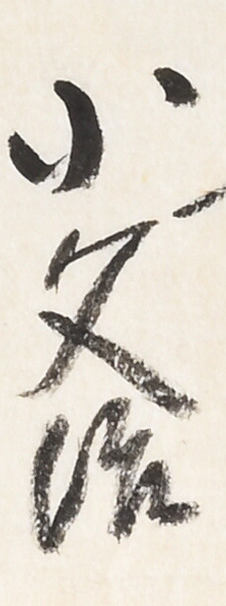小文治
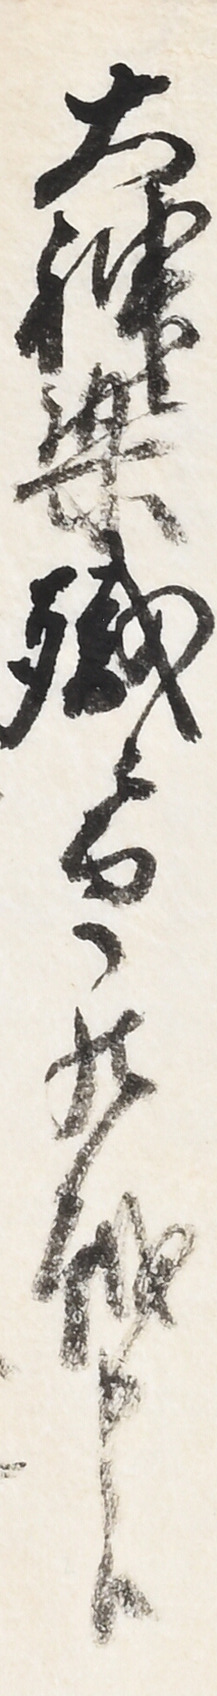大神楽職ニ而罷越申候
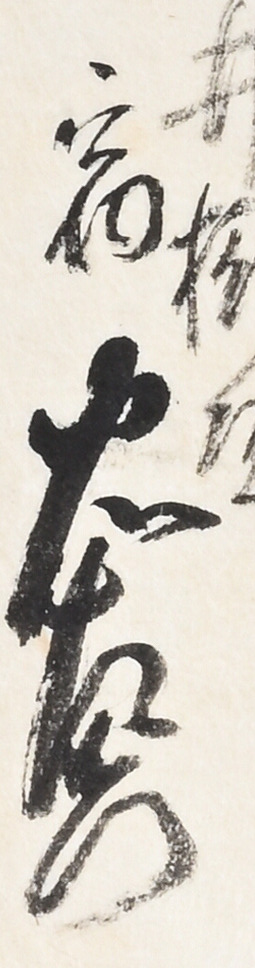宿忠左衛門
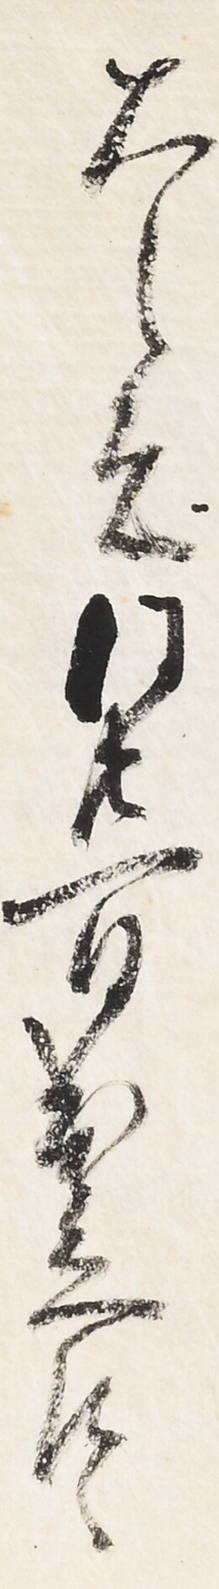右之者同廿一日出立仕候
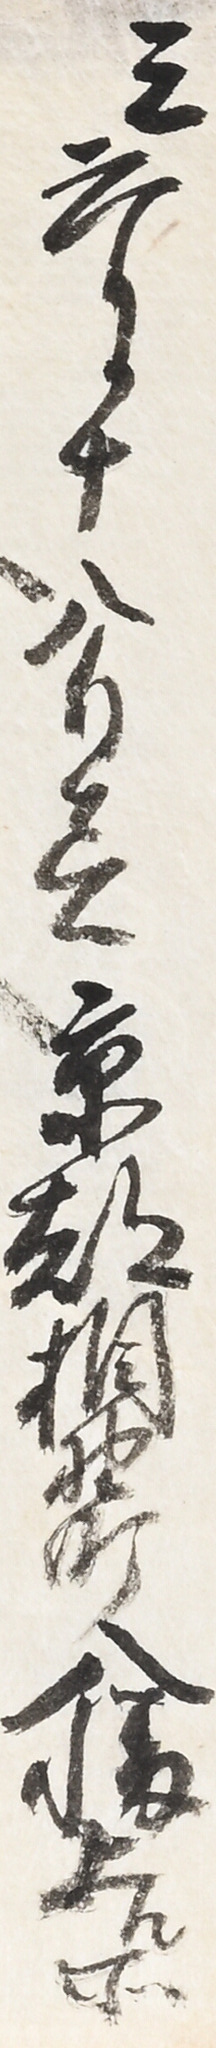壬六月十八日着京都相野町八幡上ル所
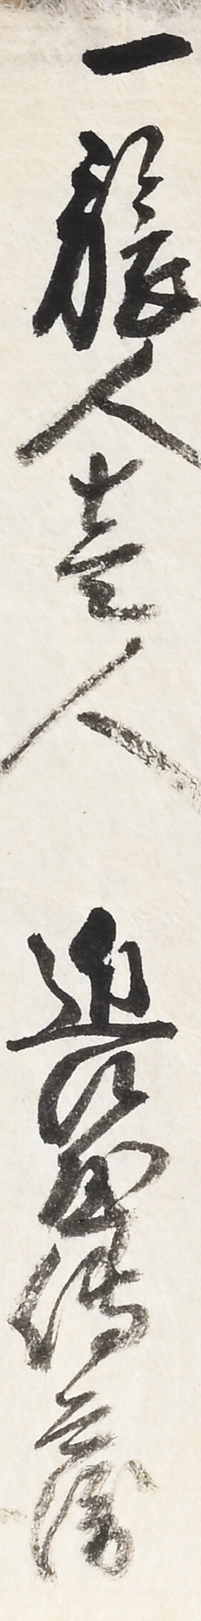一旅人壱人近江屋伝兵衛
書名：旅人泊控帳
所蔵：伊那市立高遠町図書館・合同会社AMANE
